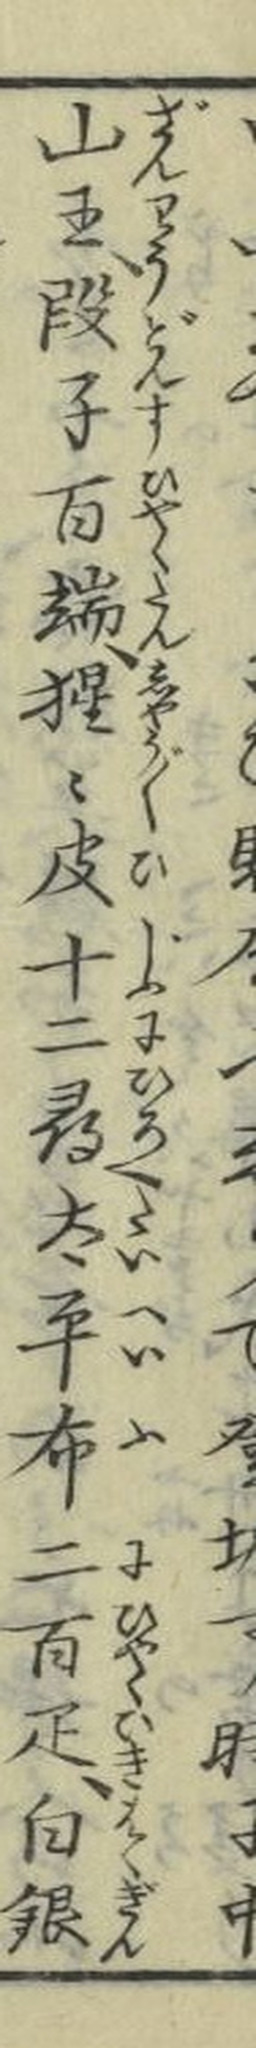山王、段子百端、猩々皮十二尋、太平布二百疋、白銀
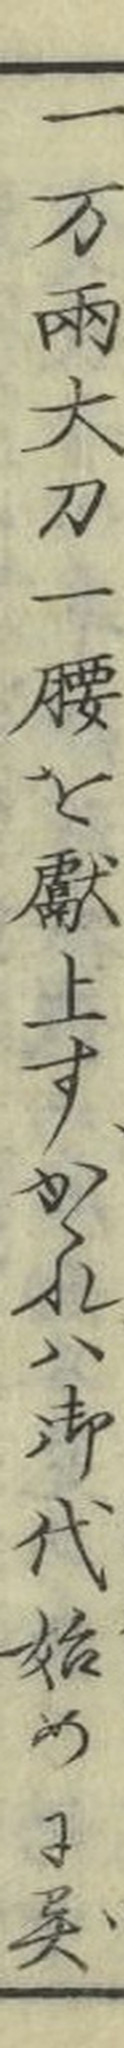一万両、大刀一腰を献上す、かゝれば御代始めに異
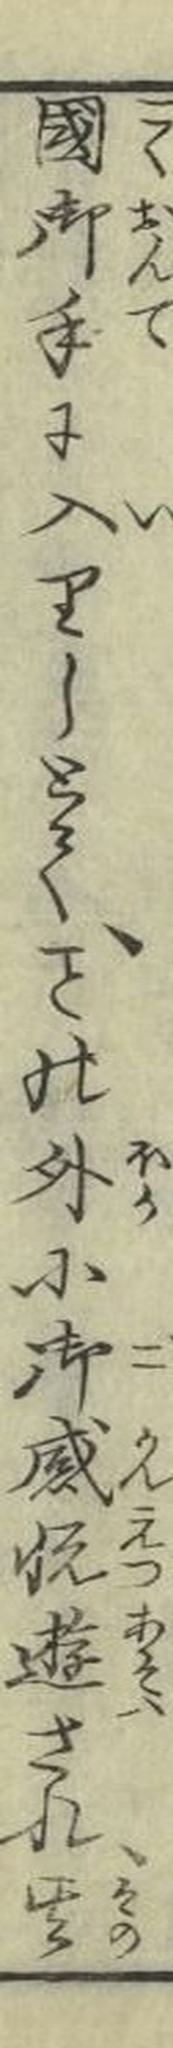国御手に入りしとて、ことの外に御感悦遊され、其
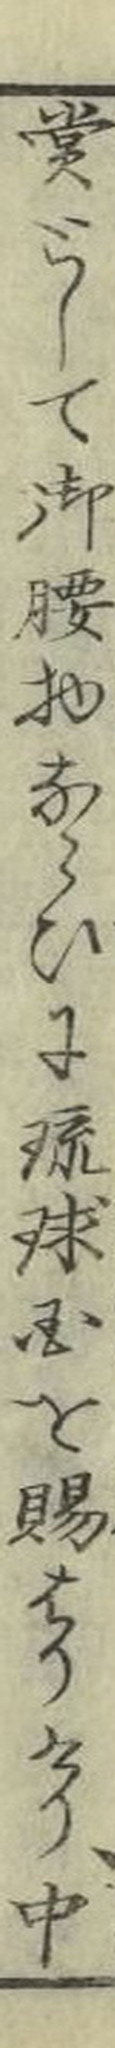賞として、御腰物ならびに琉球国を賜はりけり、中
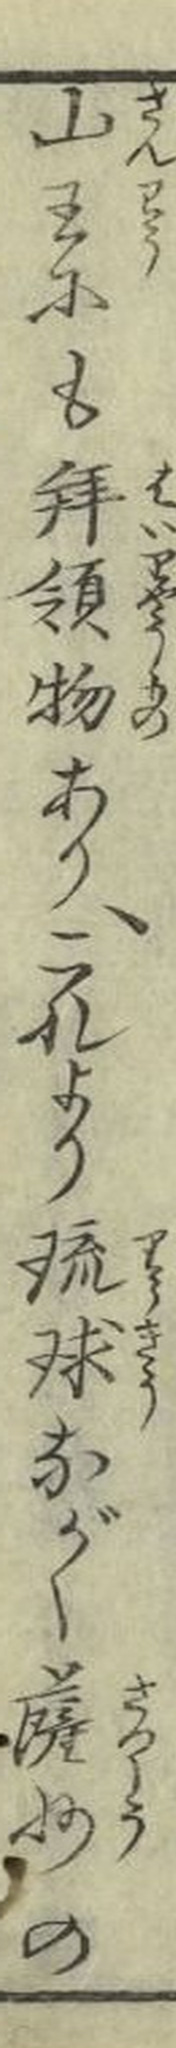山王にも拝領物あり、これより琉球ながく薩州の
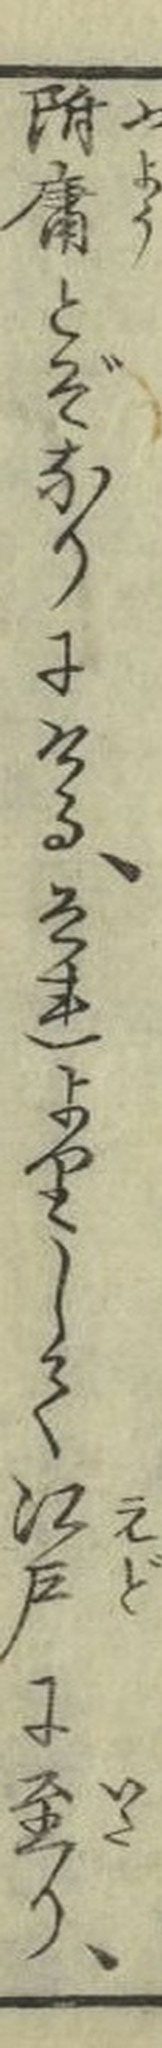附庸とぞなりにける、それよりして江戸に至り、
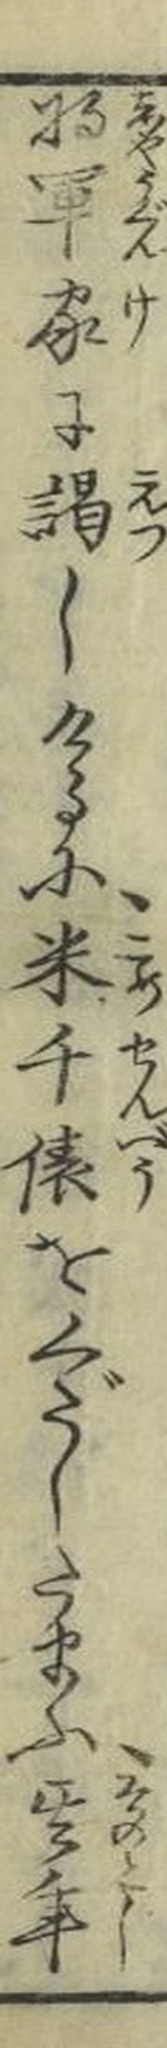将軍家に謁しけるに、米千俵をくだしたまふ、其年

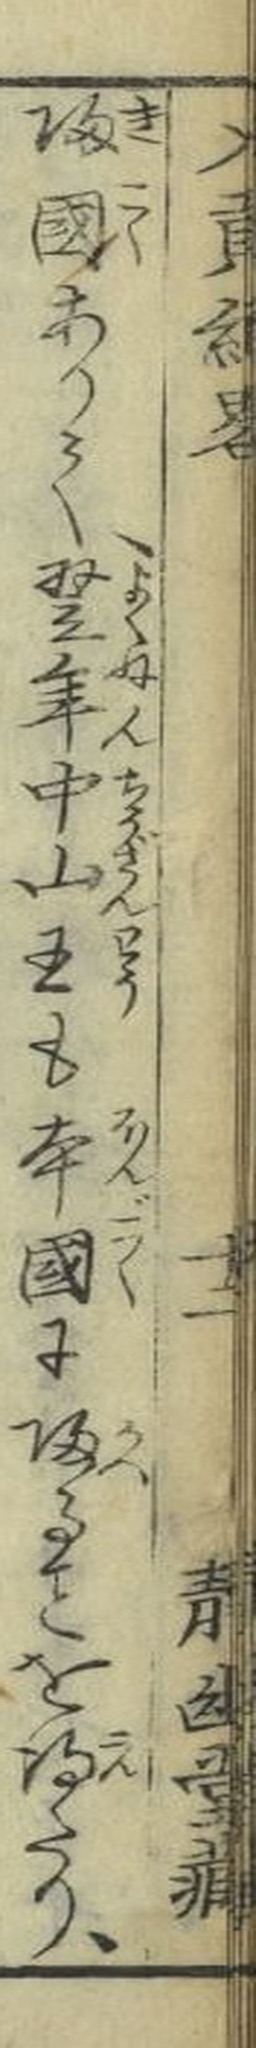帰国ありて、翌年中山王も本国に帰ることを得たり、
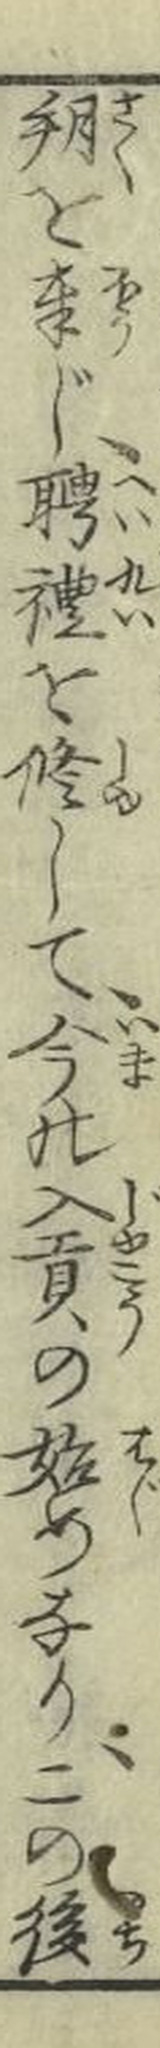朔を奉じ、聘礼を修して、今の入貢の始めなり、この後
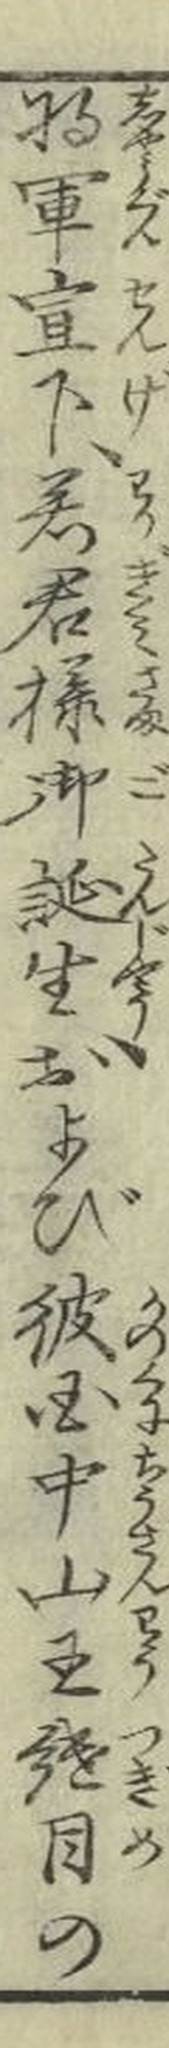将軍宣下、若君様御誕生、および彼国中山王継目の
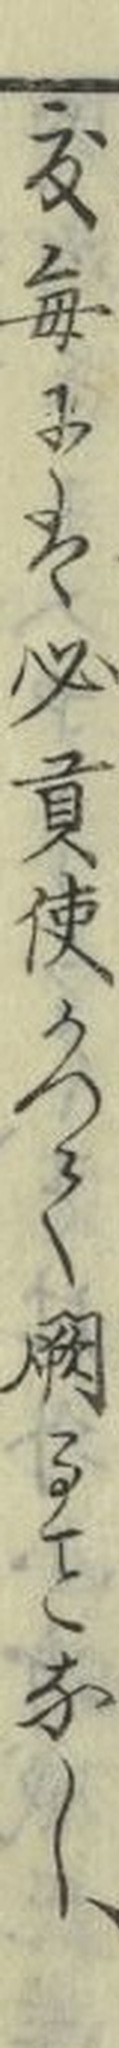度毎には、必貢使かつて闕ることなし、
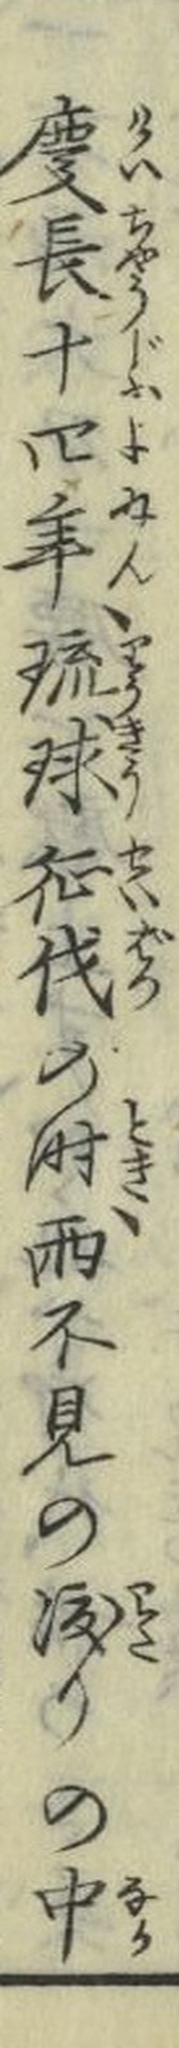慶長十四年、琉球征伐の時、雨不見の渡りの中
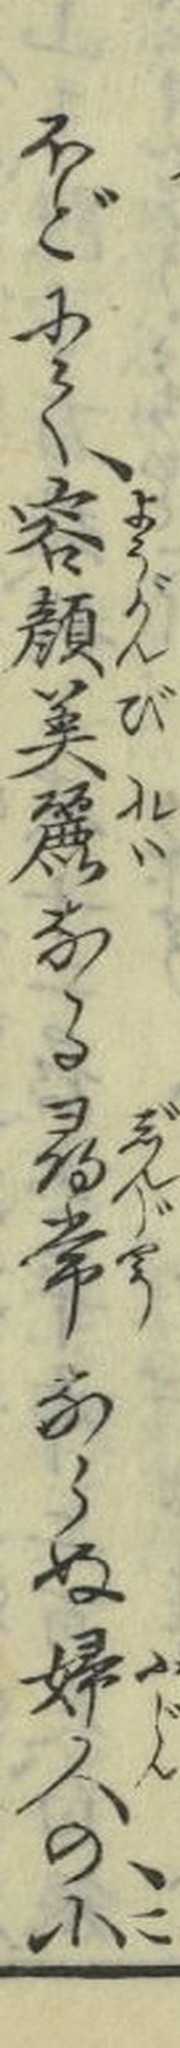ほどにて、容顔美麗なる尋常ならぬ婦人の、小
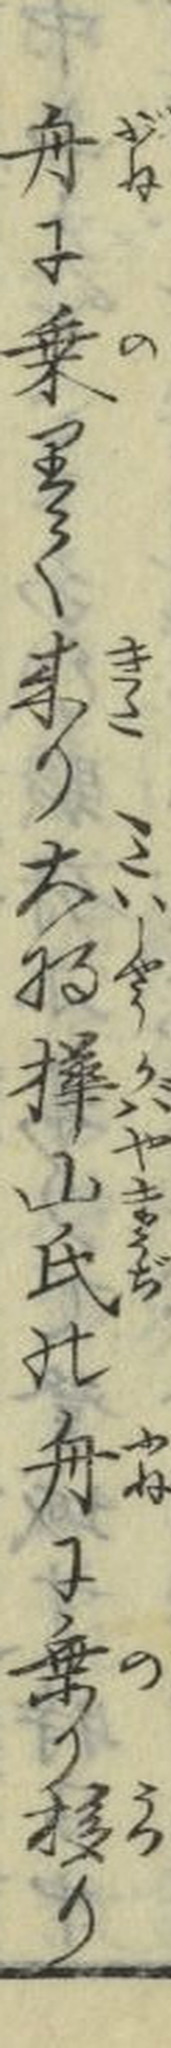舟に乗りて来り、大将樺山氏の舟に乗り移り
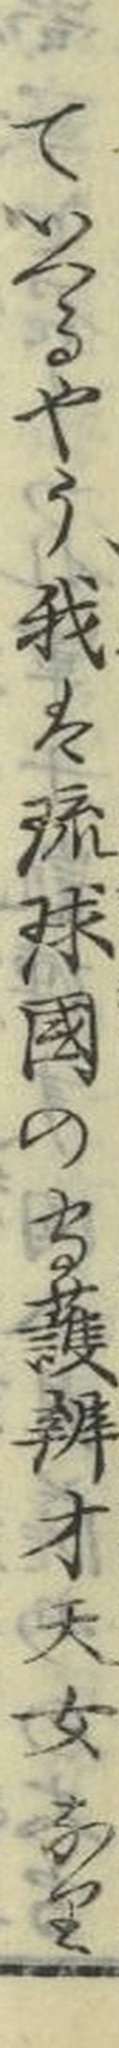ていへるやう、我は琉球国の守護弁才天女なり、
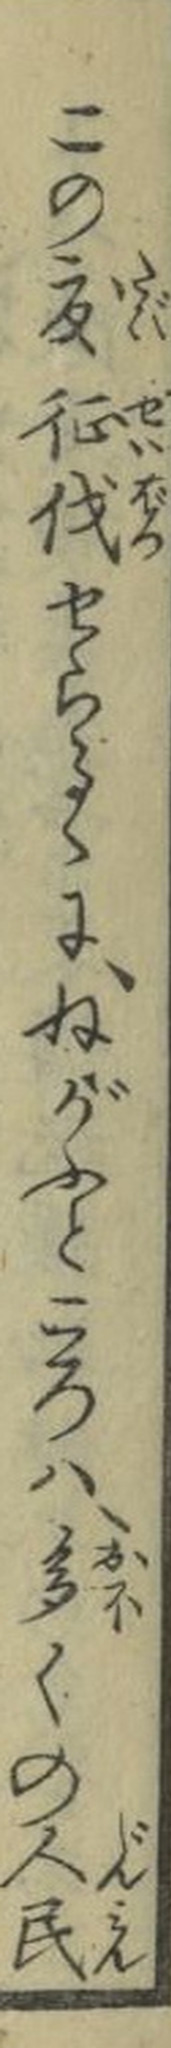この度征伐せらるゝに、ねがふところは、多くの人民
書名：琉球入貢紀略
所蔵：University of the Ryukyus Library
